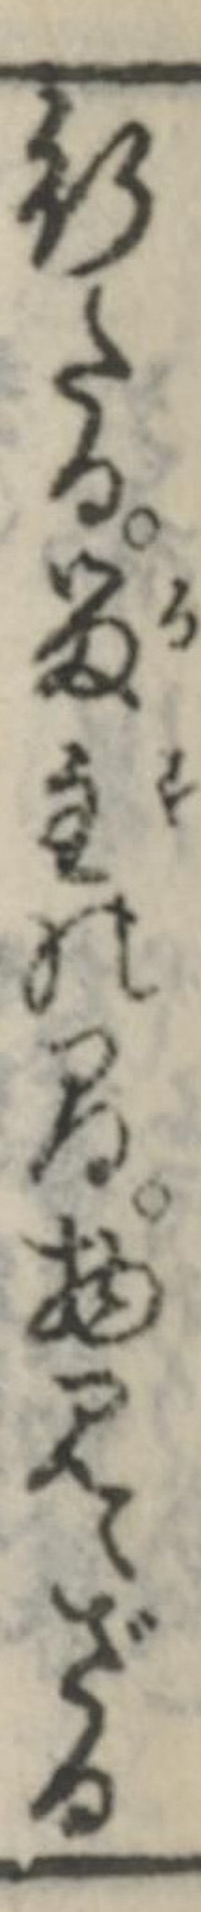行たる。留主の間。物見へざる
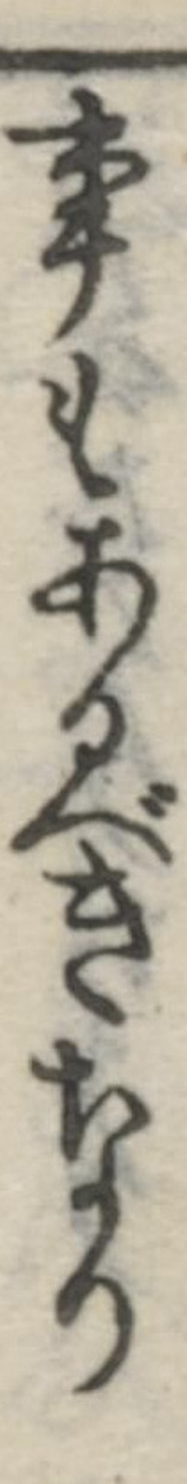事もあるべきなり
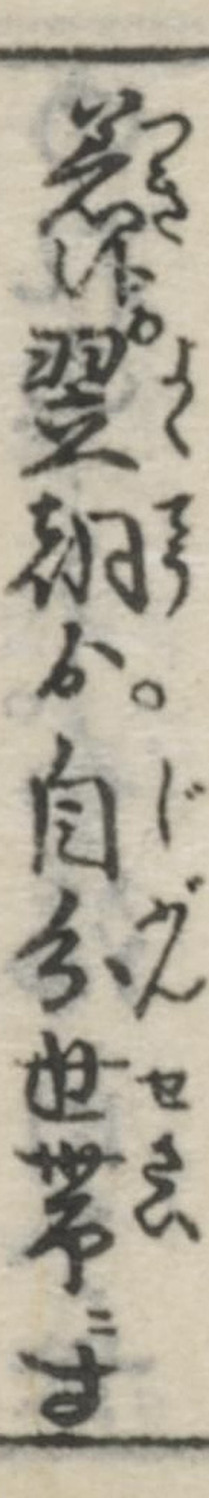着候。翌朝ゟ。自分世帯にす
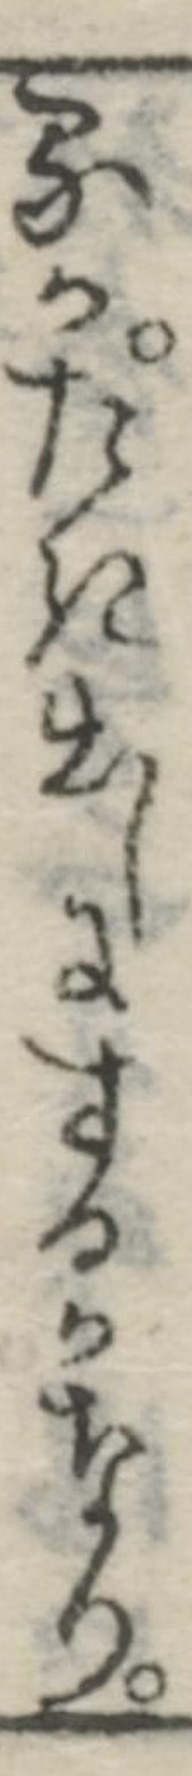るか。たき出しにするかなり。
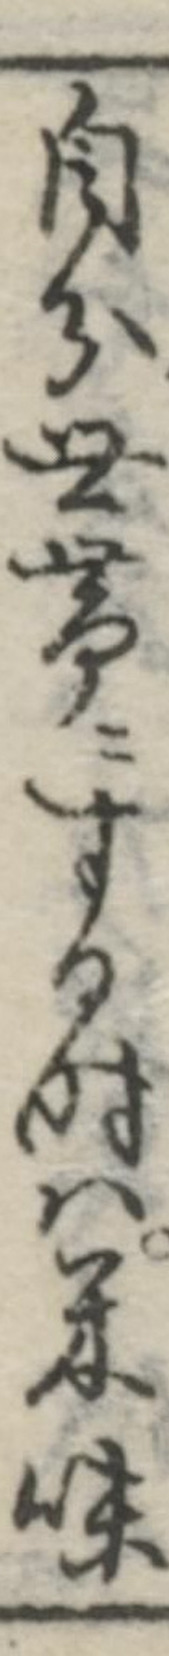自分世帯にする時は米味
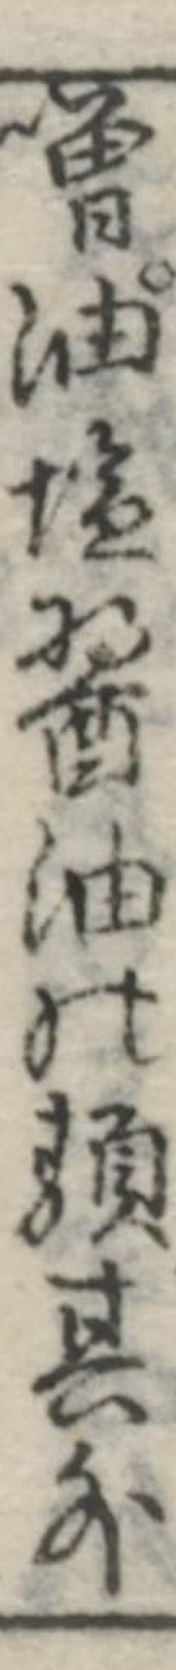噌。油塩醤油の類。其外
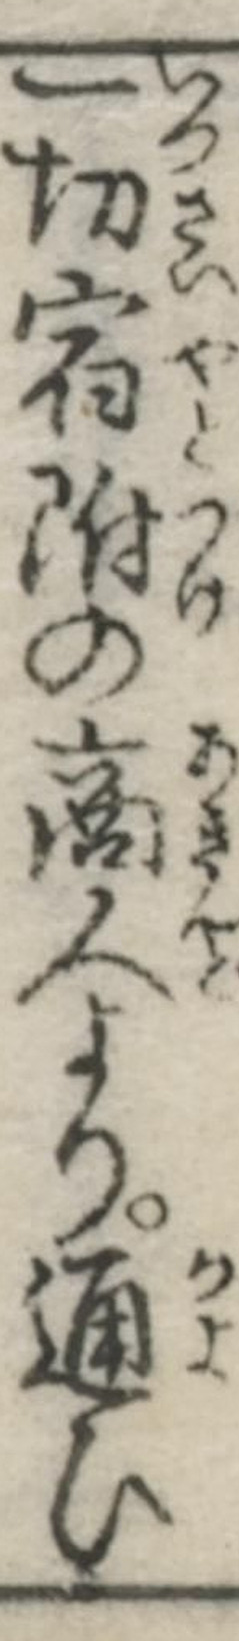一切宿附の商人より。通ひ
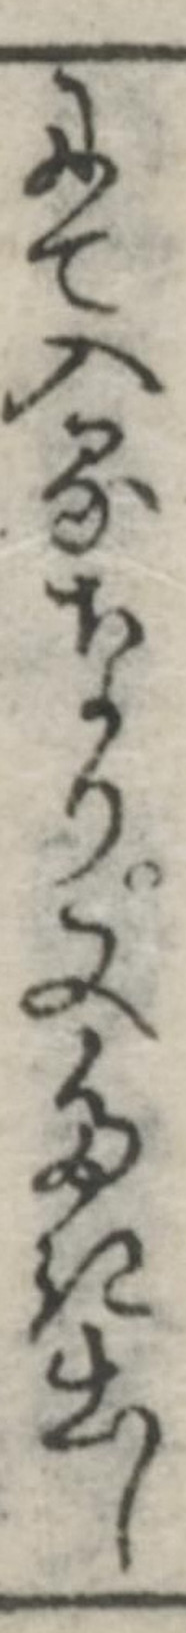にて入るなり。又たき出し
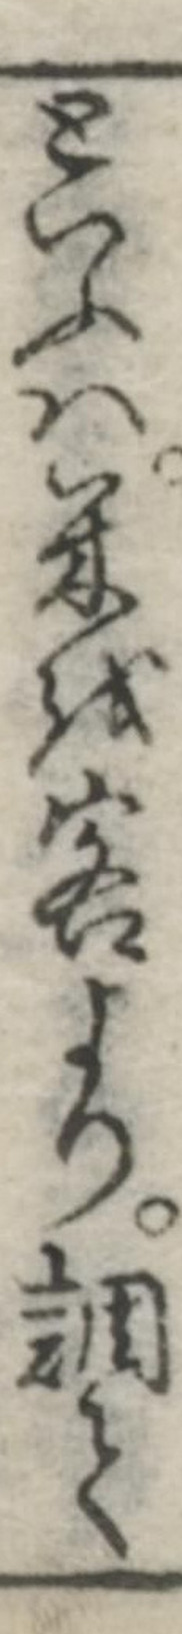といふは。米を客より。調て
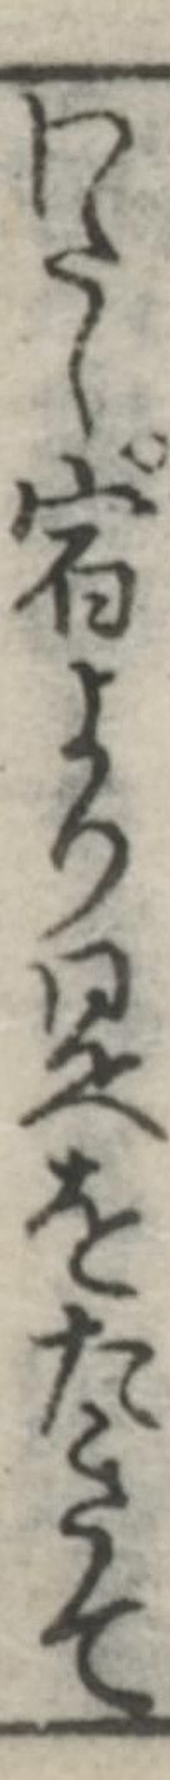わたし。宿より是をたきて。
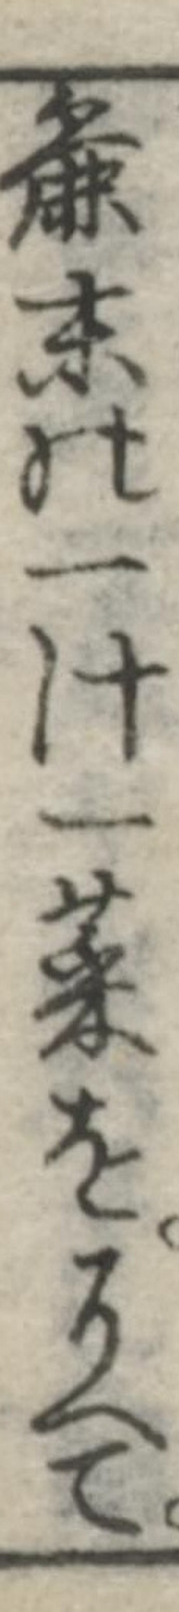廉？末の一汁一菜を。そへて。

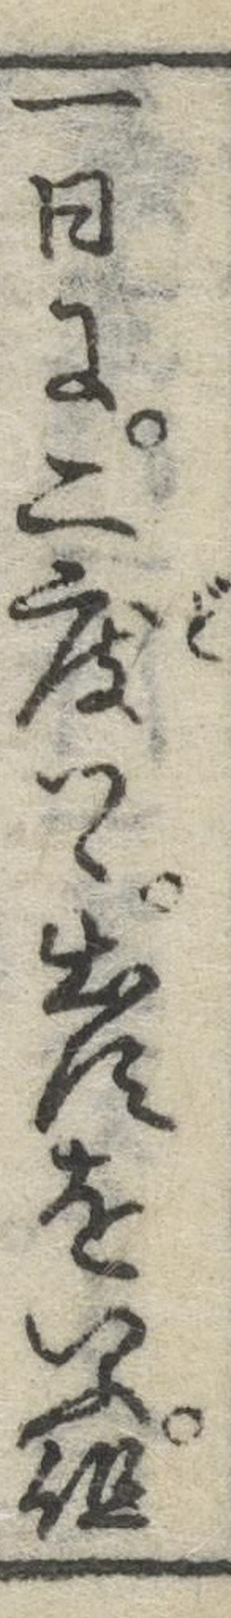一日に。二度つゝ。出すをいふ。但
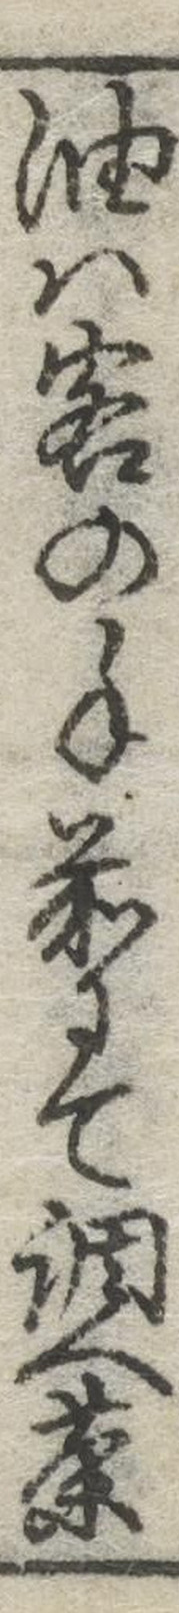油は客の手前にて調へ。茶
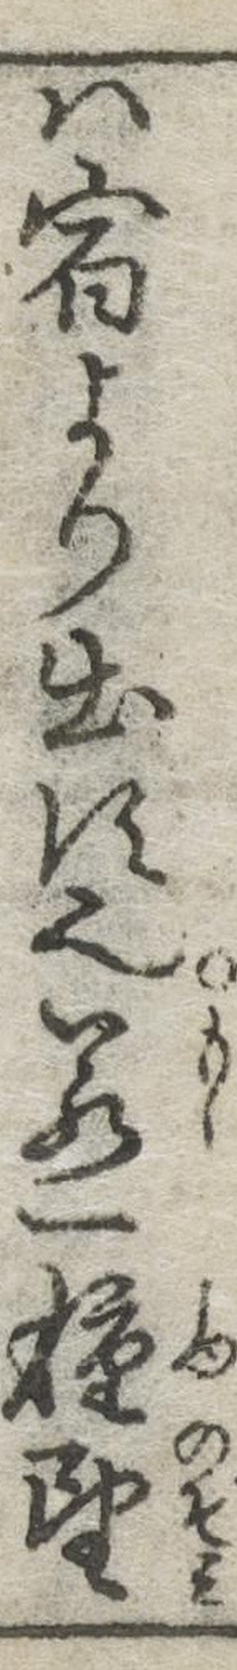は宿より出す也。若一種望
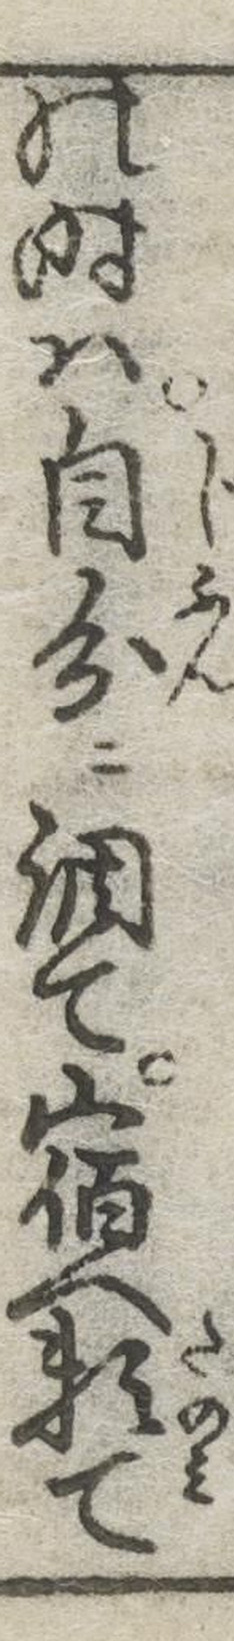の時は。自分に調て。宿へ頼て
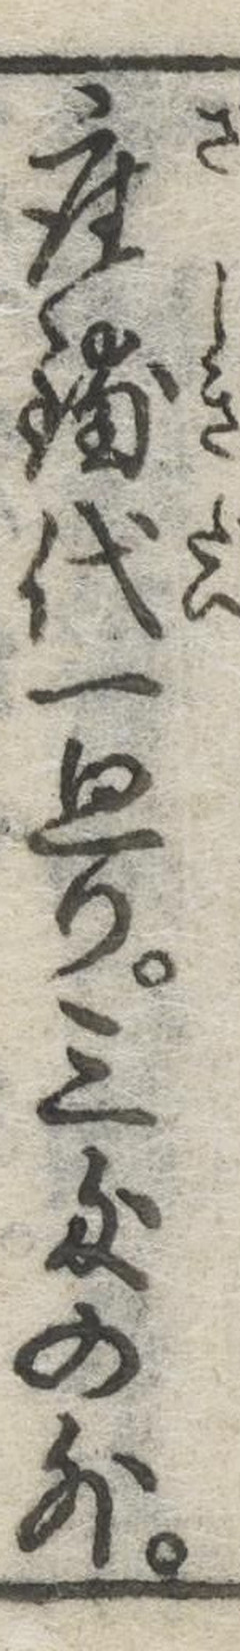座敷代一廻り。三匁の外。
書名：但州城崎浴湯辧
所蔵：東京大学地震研究所図書室 Earthquake Research Institute Library, The University of Tokyo, JAPAN
